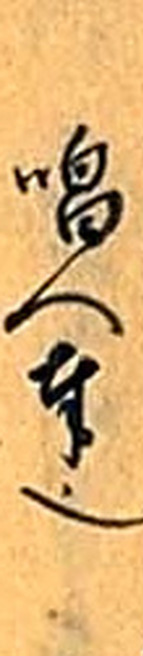唱へ奉也
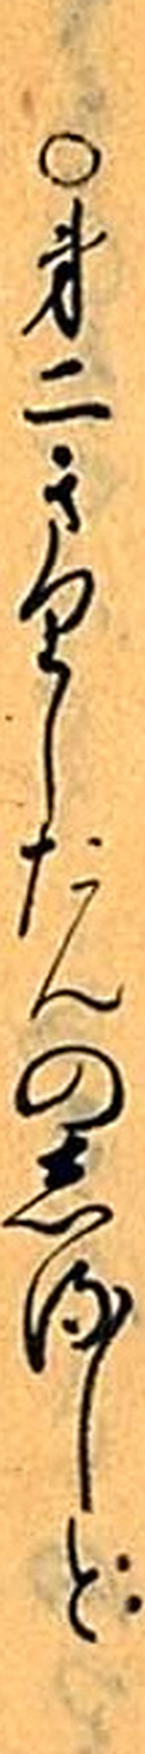○第二きりしたんのしるしと
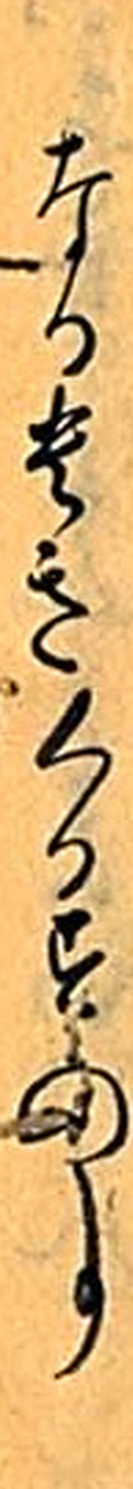なる貴きくるすの事
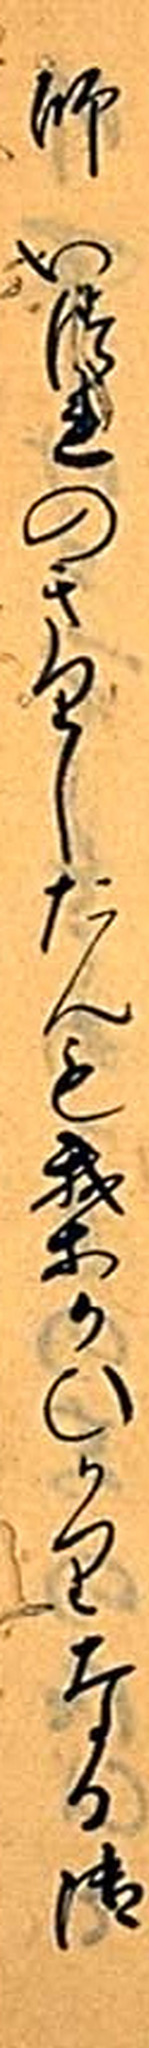師いつれのきりしたんも我等かひかりなる御
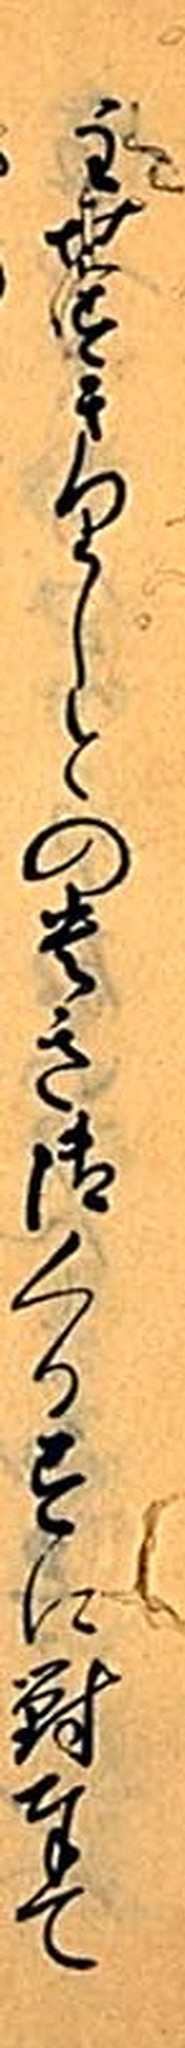主せすきりしとの貴き御くるすに対奉て
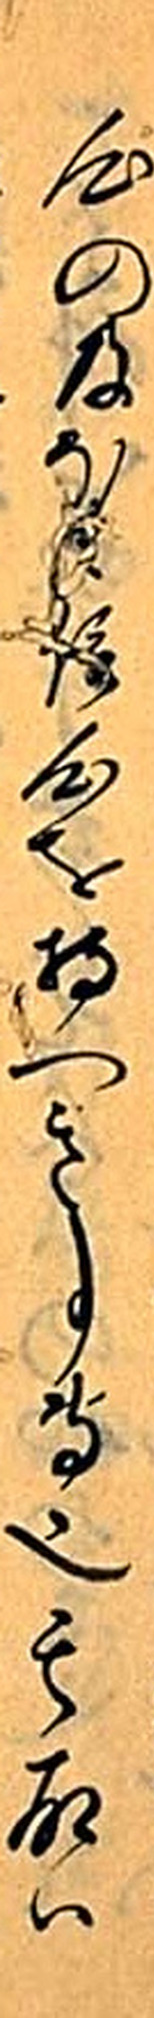心の及ほ信心を持へき事専也其故は
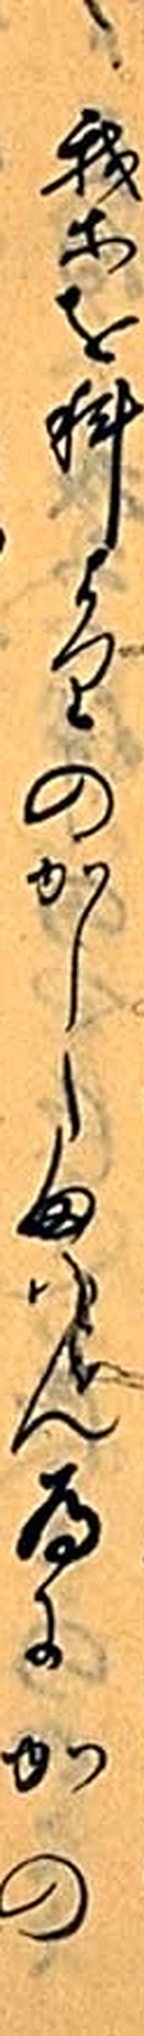我等を科よりのかしたまはん為にかの
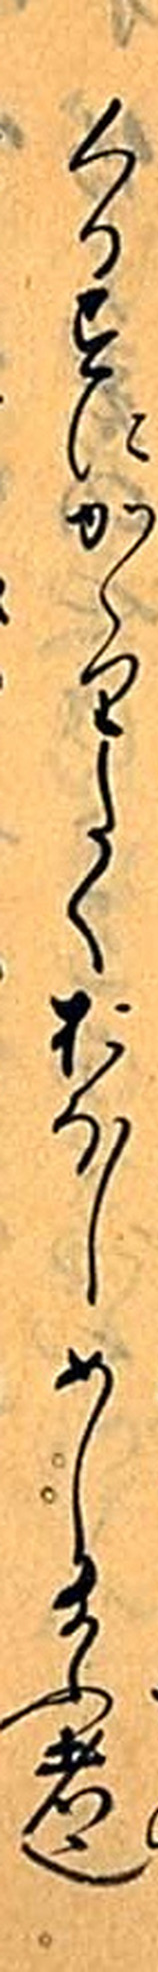くるすにかゝりたくおほしめし給ふ者也
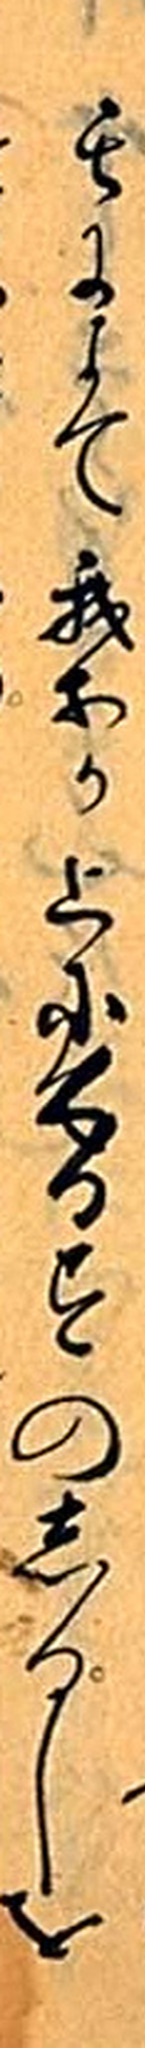其によて我等か上にくるすのしるしを
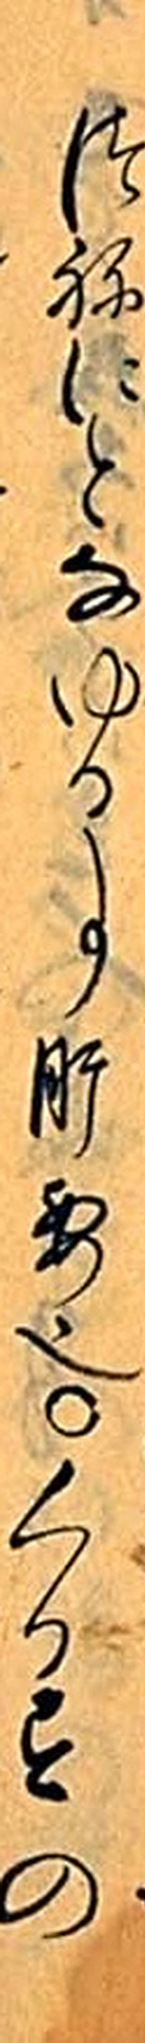つねにとなゆる事肝要也○くるすの
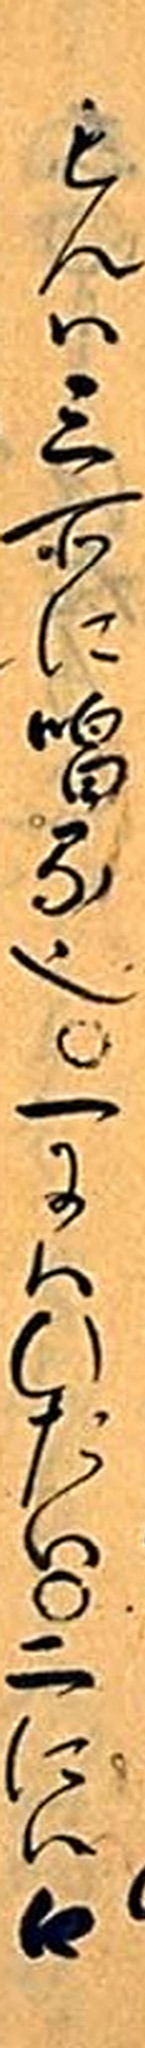もんは三所に唱る也○一にはひたい○二には口
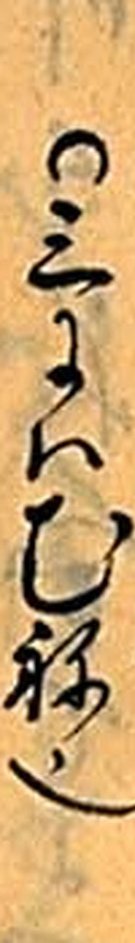○三にはむね也
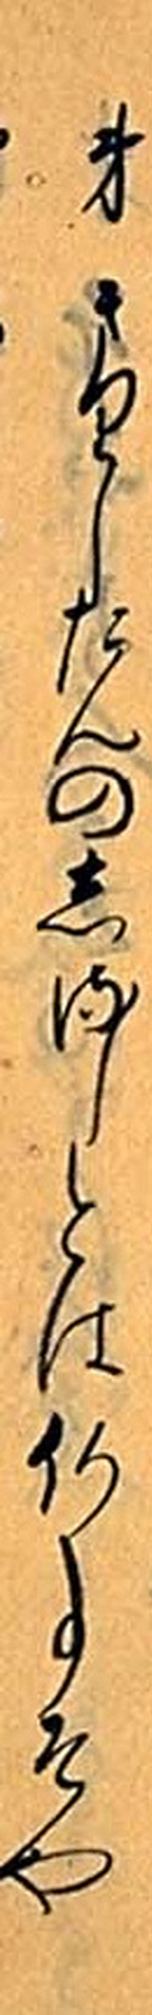弟きりしたんのしるしとは何事そや
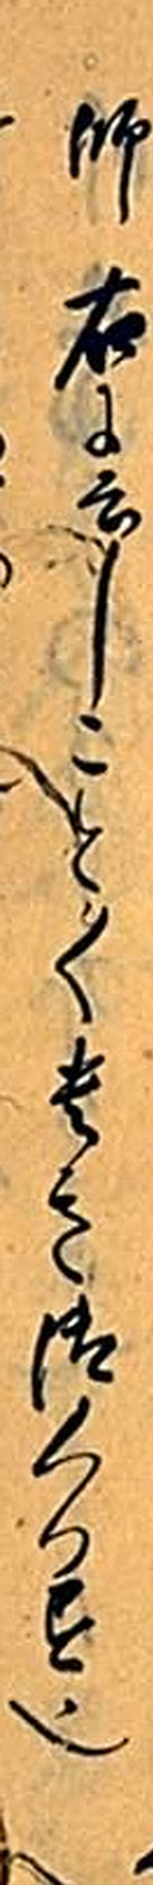師右に云しことく貴き御くるす也
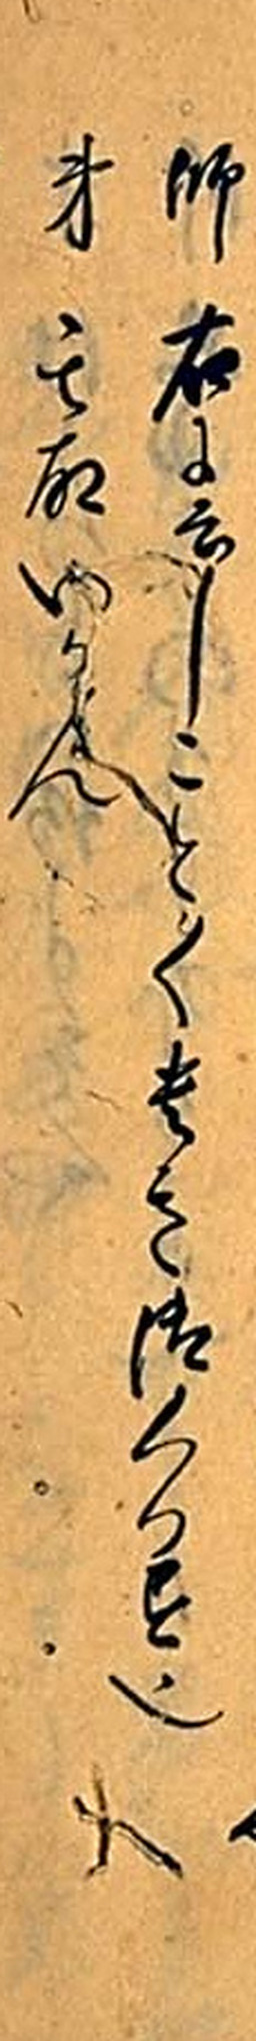弟其故いかん
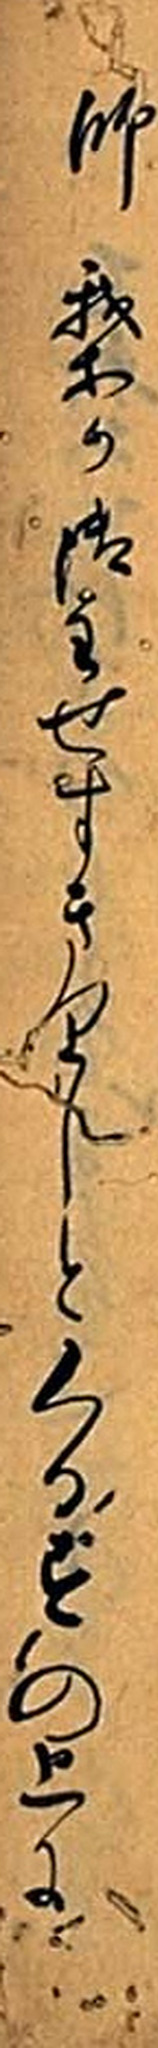師我等か御主せすきりしとくるすの上に
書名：ドチリナ・キリシタン
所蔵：東京大学総合図書館 / General Library in the University of Tokyo
